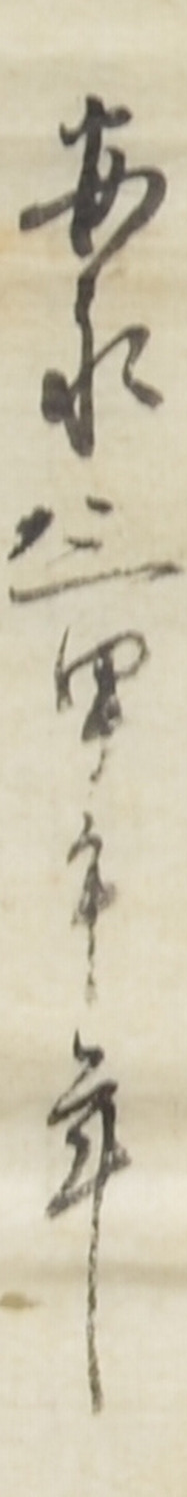安永三甲午年
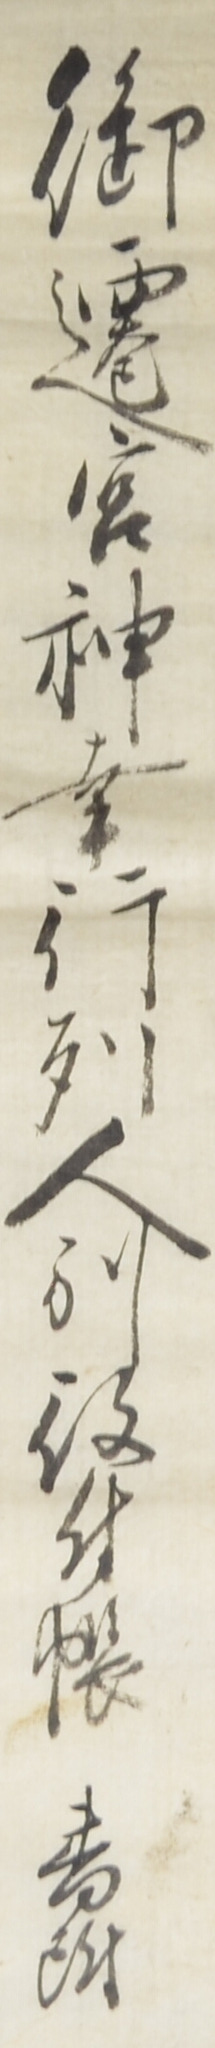御遷宮神幸行列人別役付帳番附
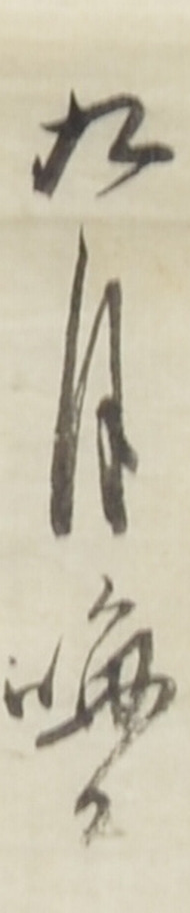九月晦日
